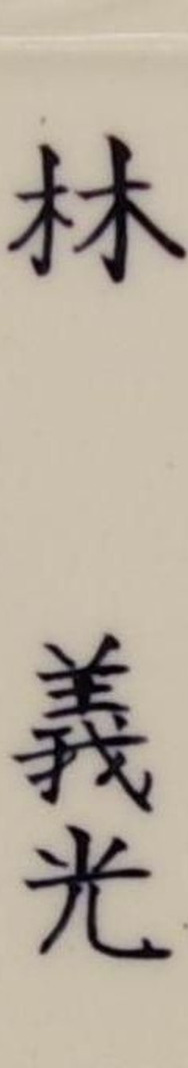林義光
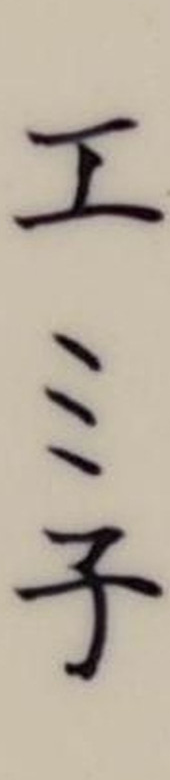エミ子
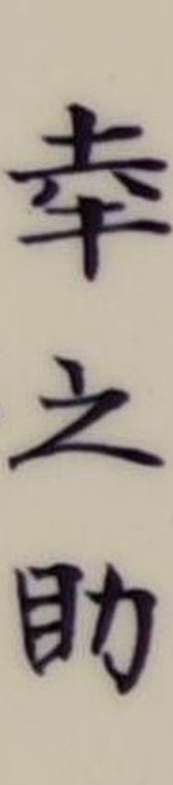幸之助
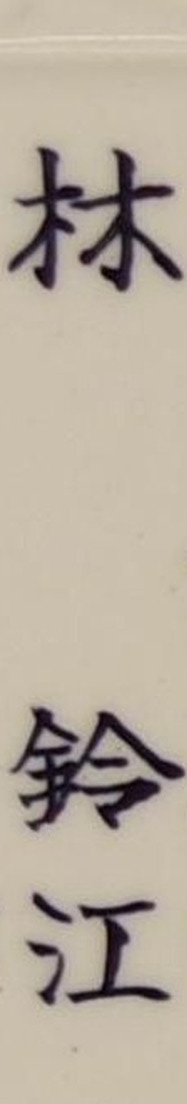林鈴江

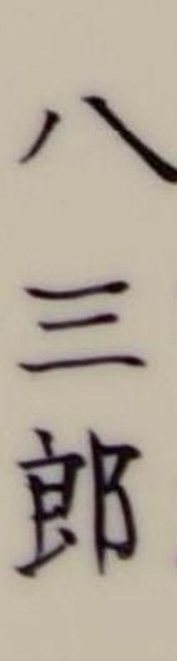八三郎
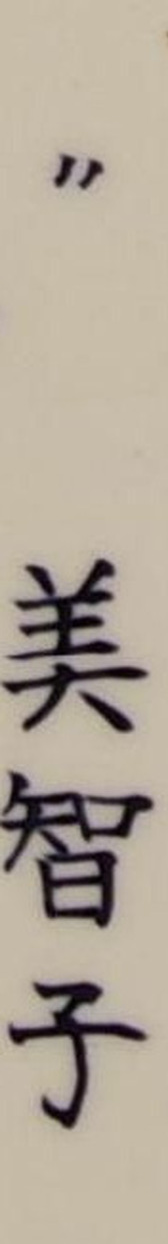美智子
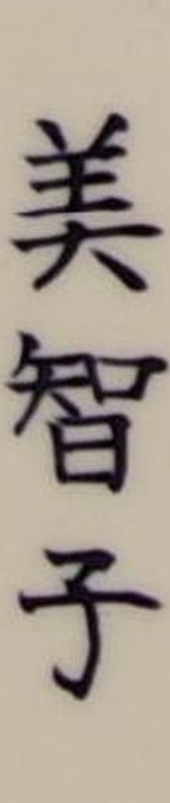美智子
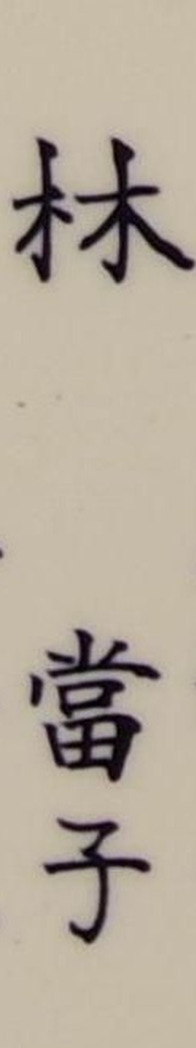林當子

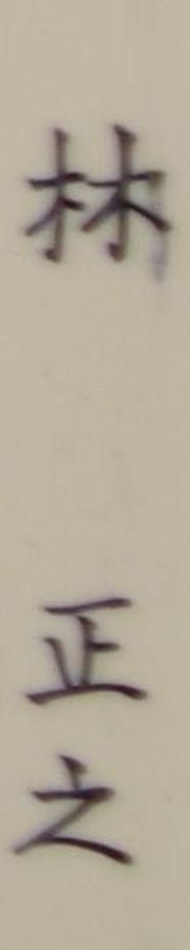林正之
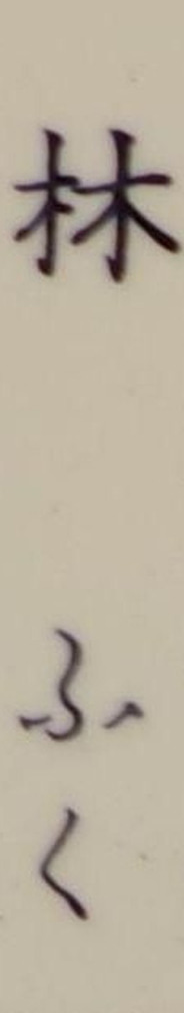林ふく
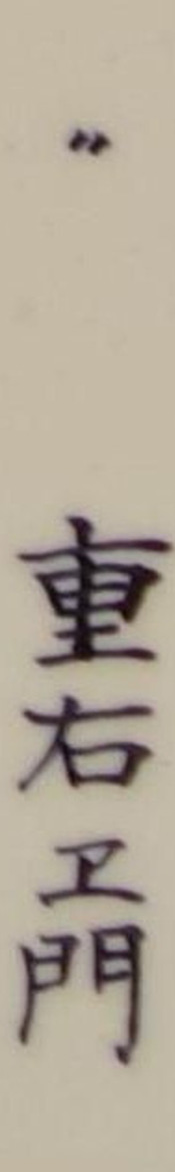重右ヱ門
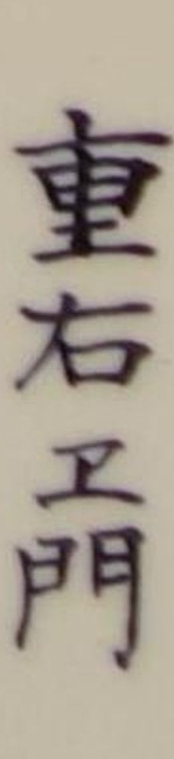重右ヱ門
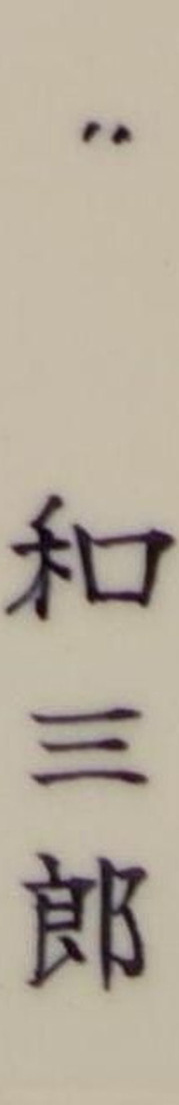和三郎
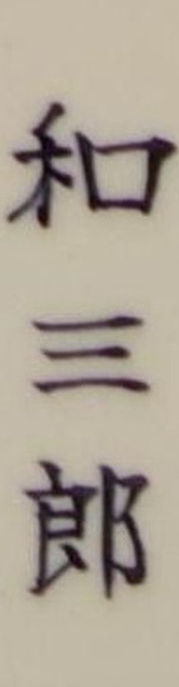和三郎
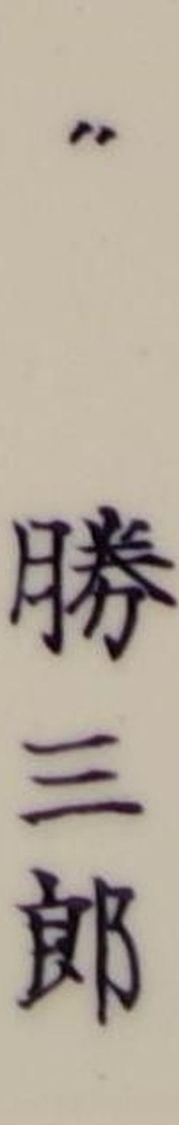勝三郎
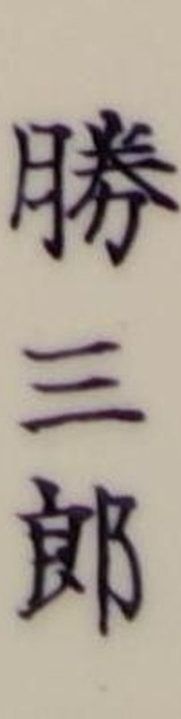勝三郎
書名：M~S
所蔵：高野山金剛峯寺
